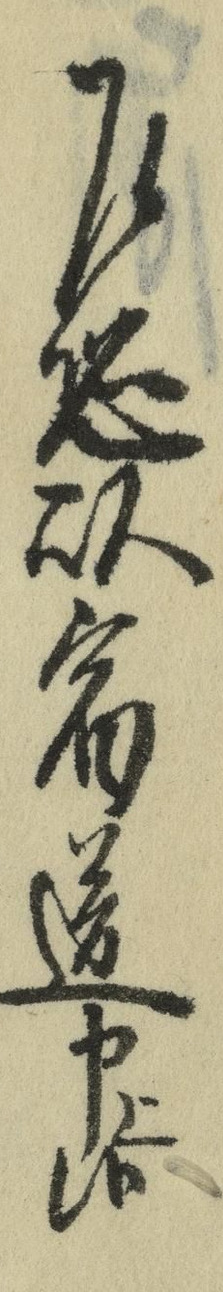乍恐以宿送申上候
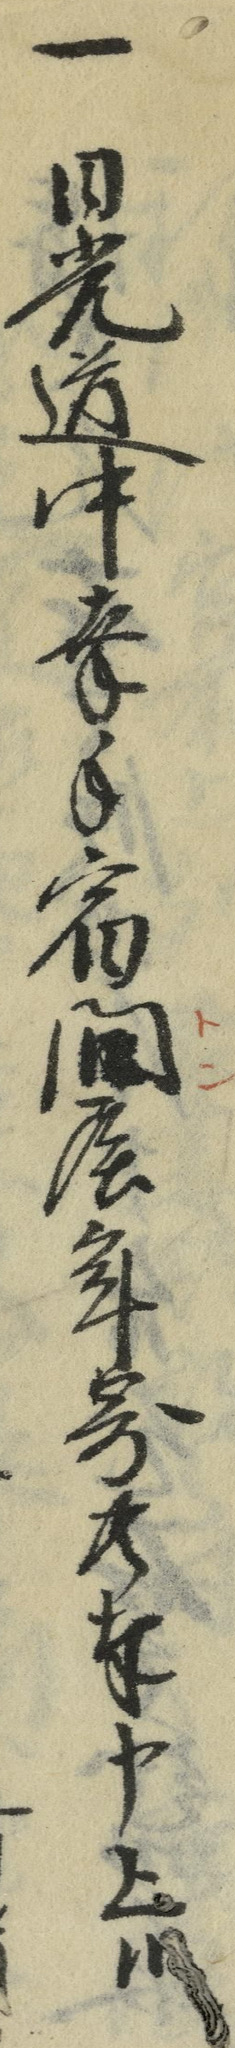一日光道中幸手宿問屋年寄共奉申上候
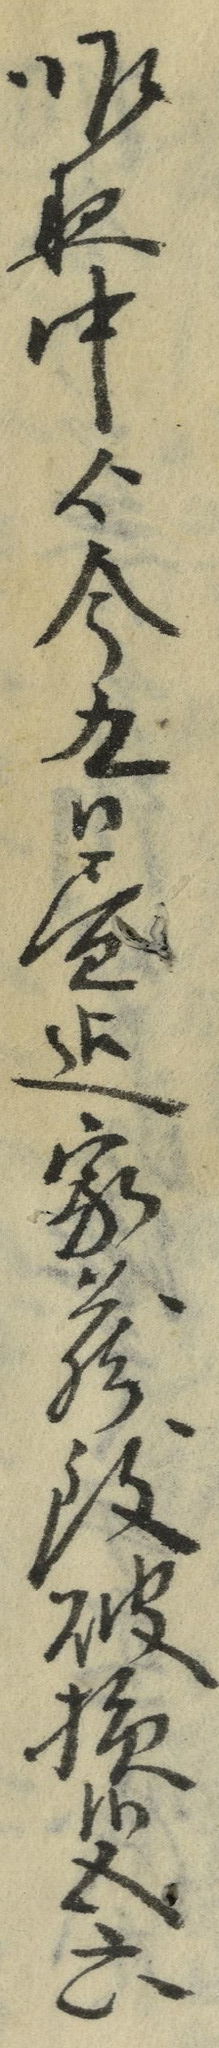昨夜中ゟ今九日昼迄家蔵致破損候五六
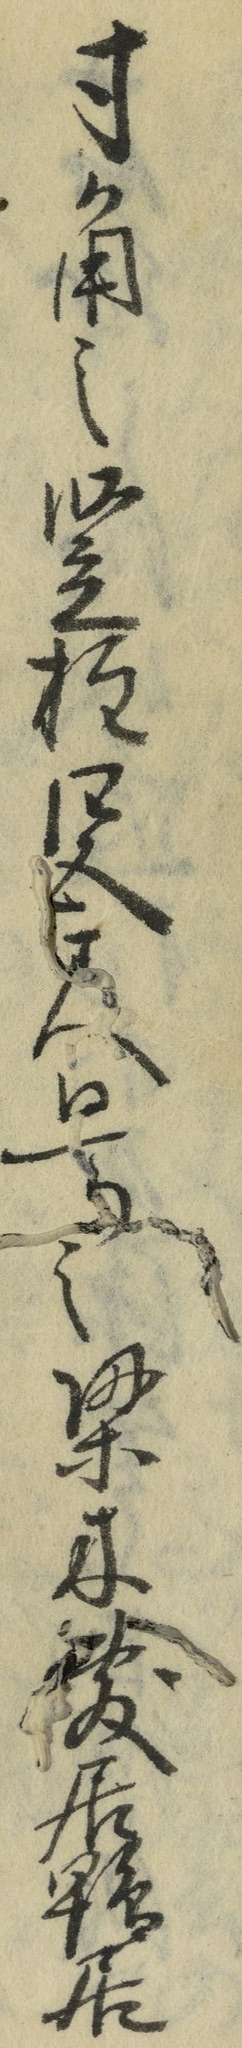寸角之竪柱四五尺廻り之梁木敷居鴨居
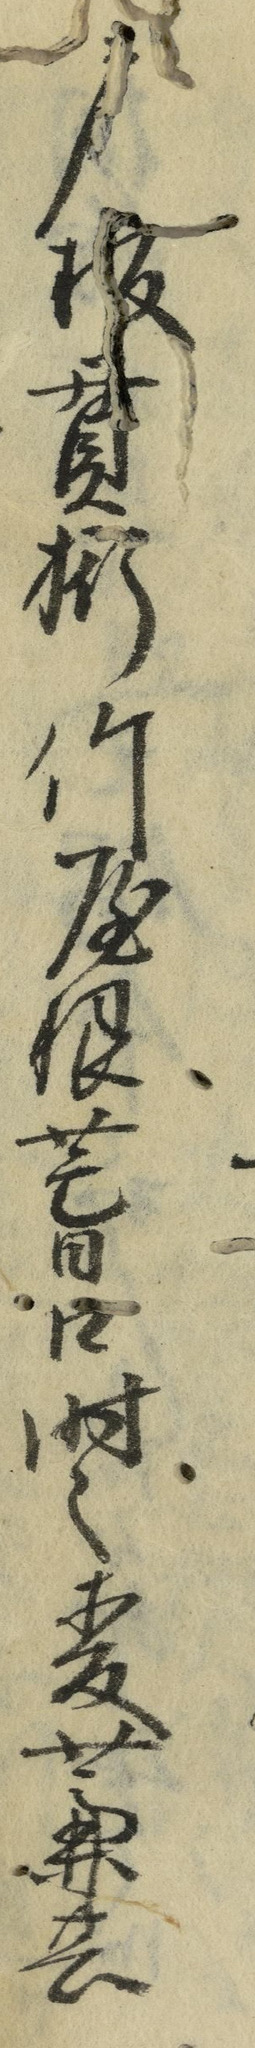戸板貫桁竹屋根芒日口時之麦藁其
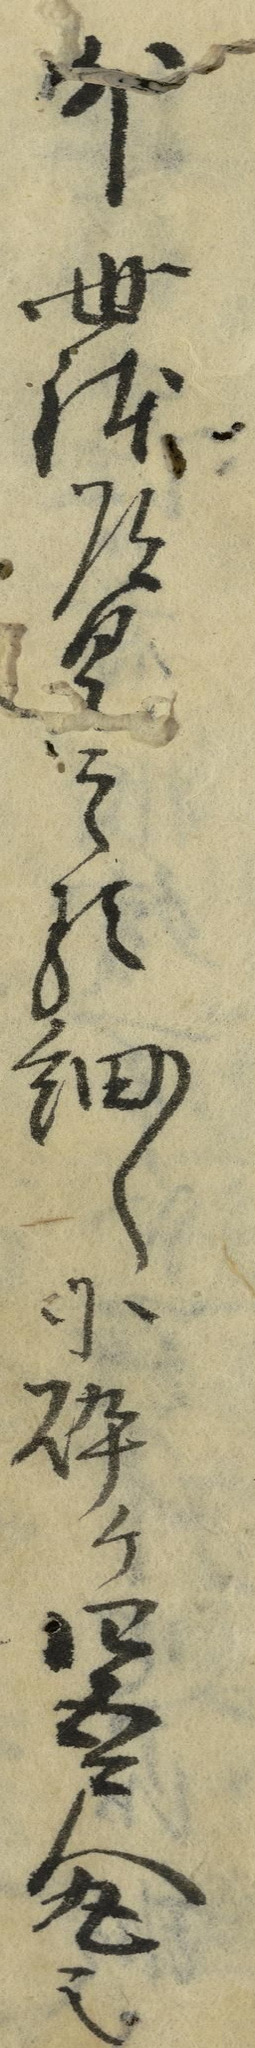外世体道具之類細々に砕ケ四五尺丸之
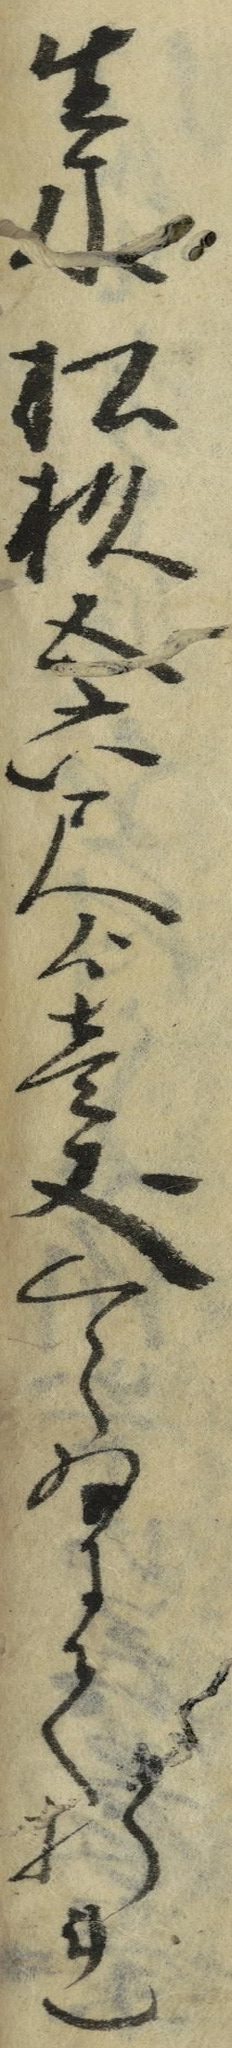生木松杦五六尺ゟ壱丈くらゐにて折れ
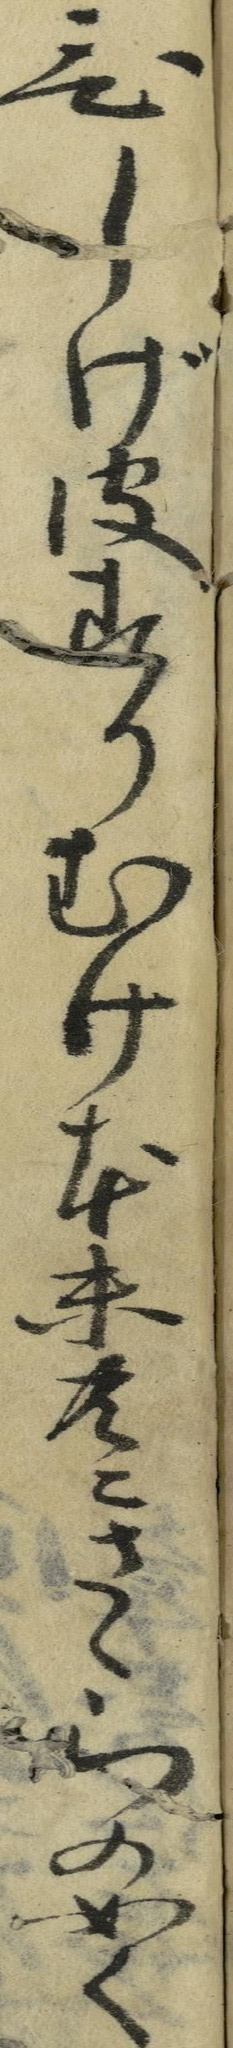ひしげ皮すりむけ本末共こさゝらの如く
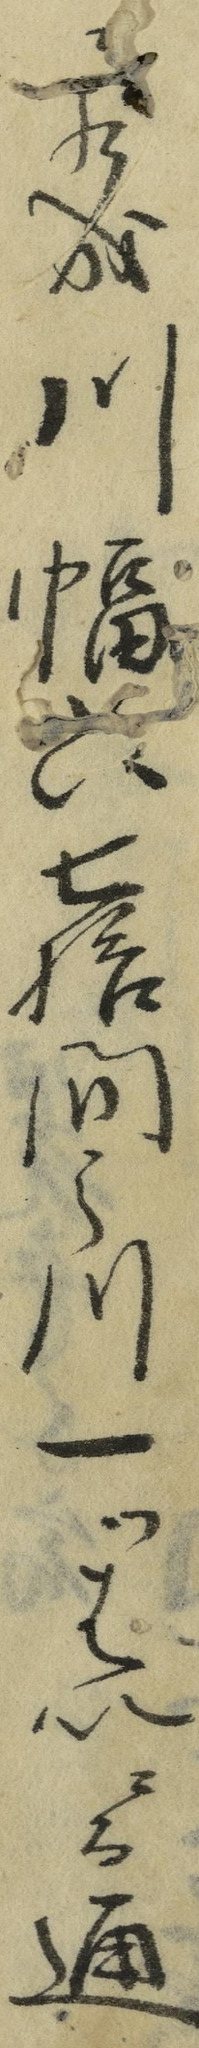相成川幅六七拾間之川一つはいに而通
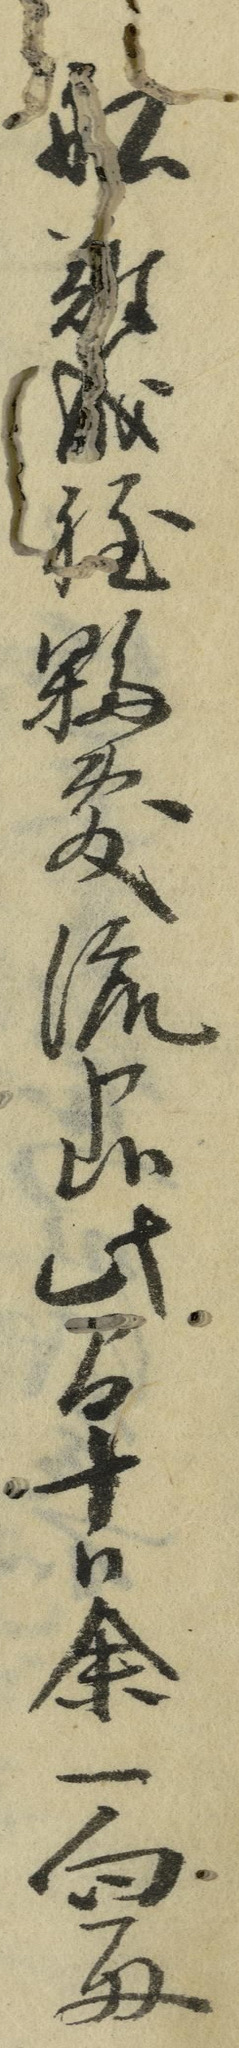舩難成程夥敷流申候此間十日余一向雨
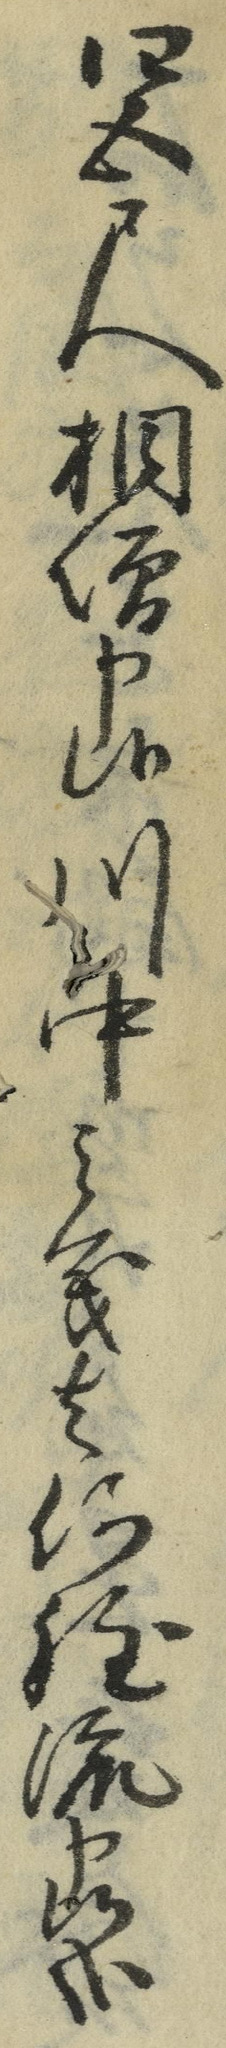四五尺相増申候川中之義は何程流申候哉
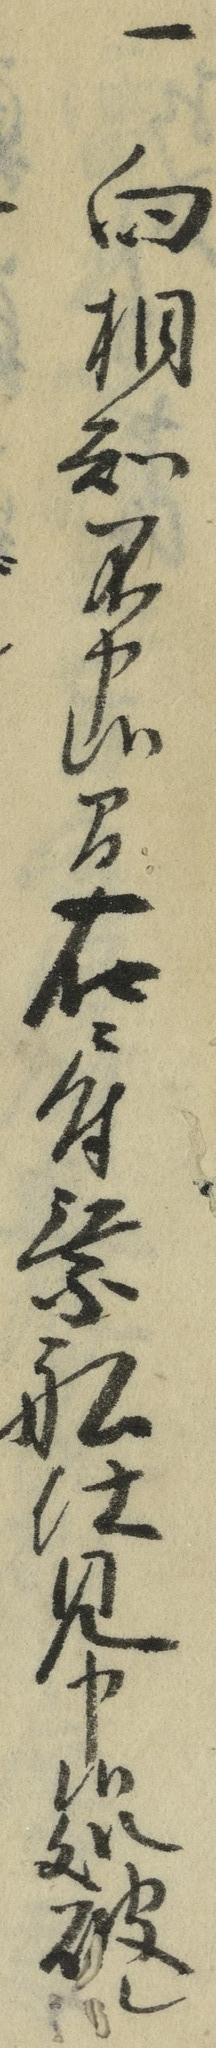一向相知不申候間右に付乗舩仕見申候処破レ
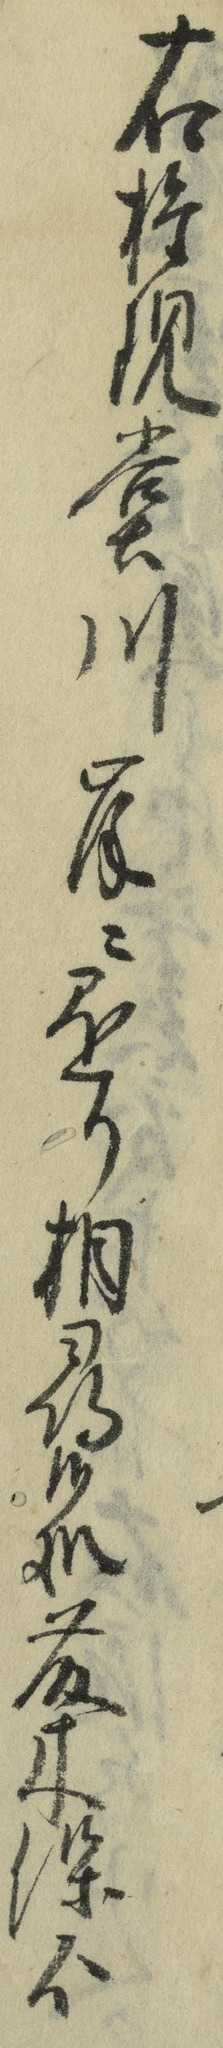右権現堂川岸に懸り相尋候処藤木保ゟ

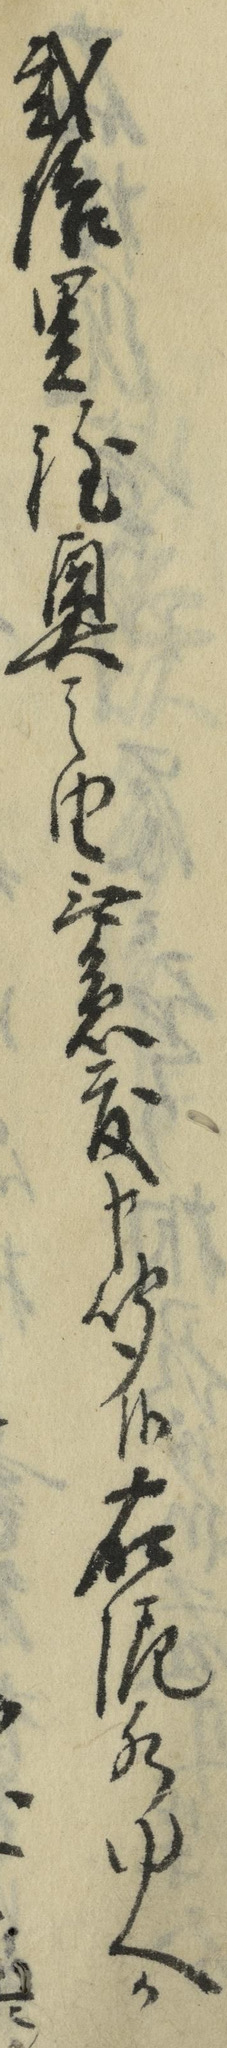弐拾里程奥之由無急度申聞候右泥水ゆへか
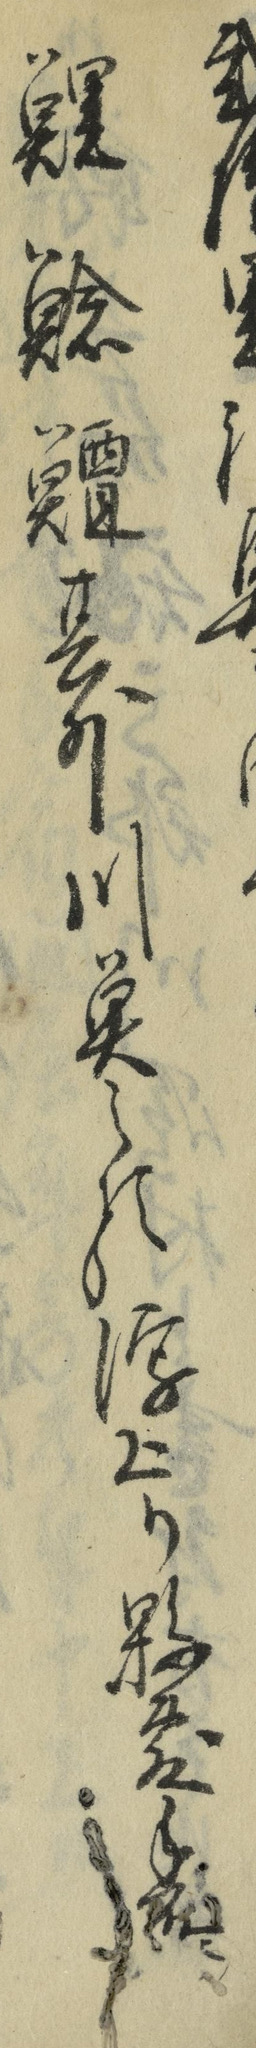鯉鯰鰻其外川魚之類浮上り夥敷ものに
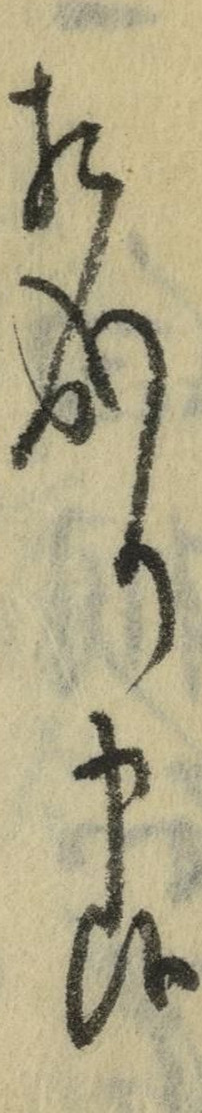相成り申候
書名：天明三卯年七月　浅間山焼注進写
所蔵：東京大学地震研究所図書室 Earthquake Research Institute Library, The University of Tokyo, JAPAN
